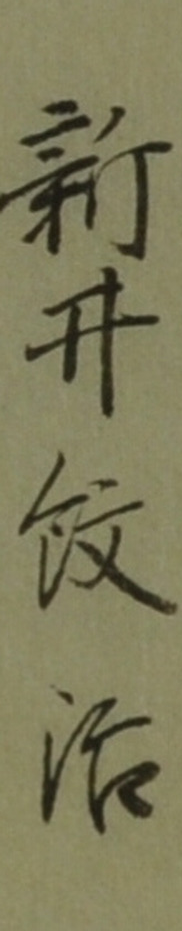新井紋治
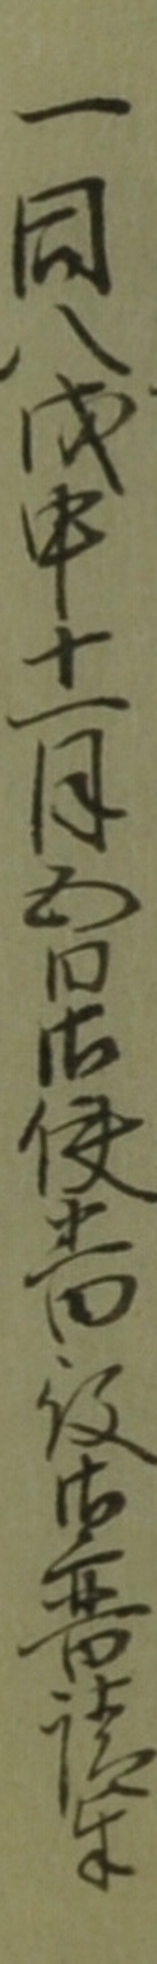一同八戊申十一月五日御使番役御普請奉
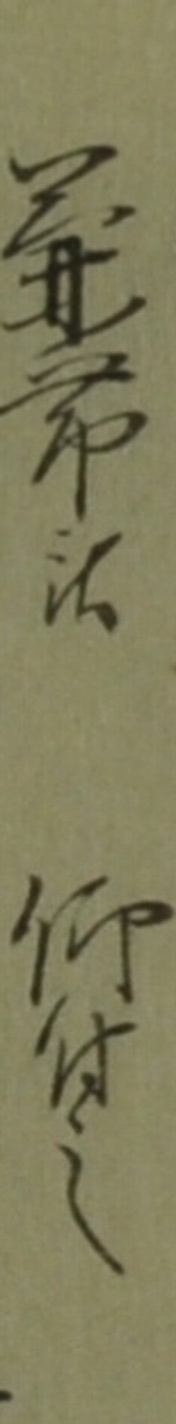兼帯被仰付之
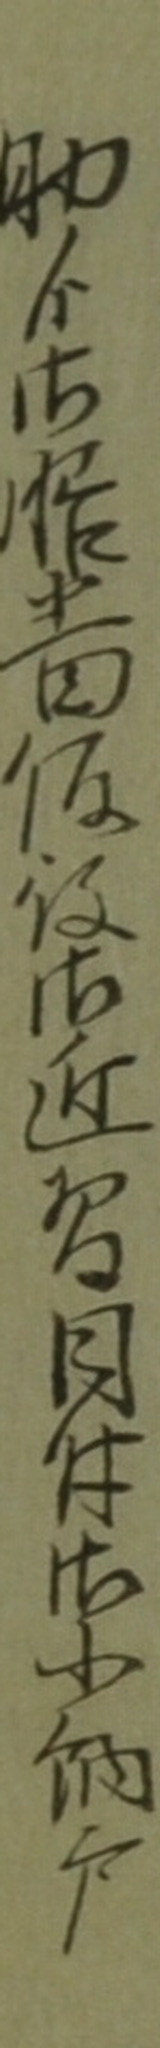助ゟ御膳番仮役御近習目付御小納戸
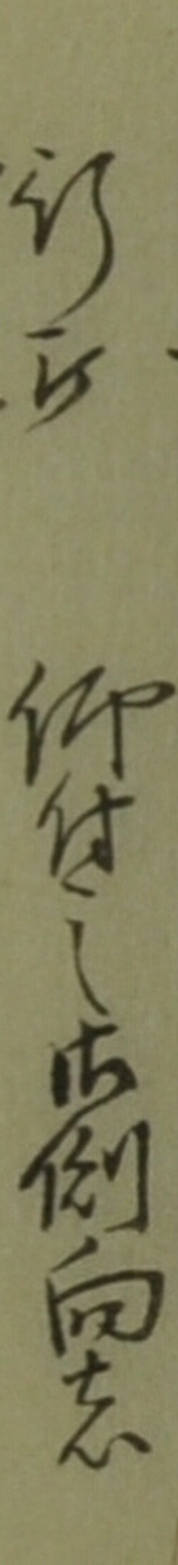行被仰付之御側向者

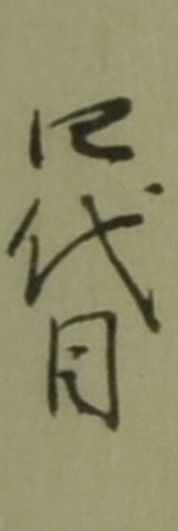四代目
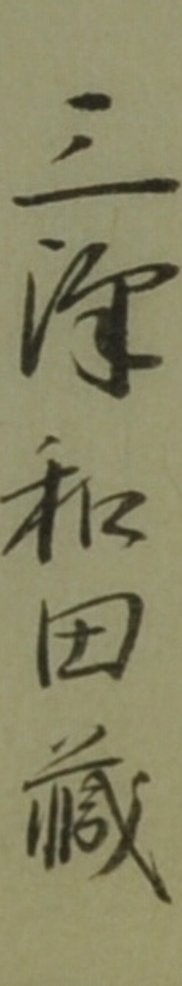三沢和田蔵
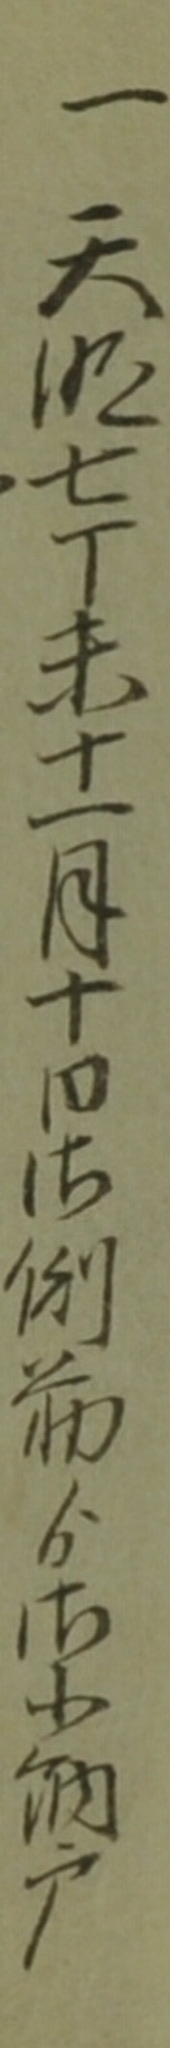一天明七丁未十一月十日御側勤ゟ御小納戸
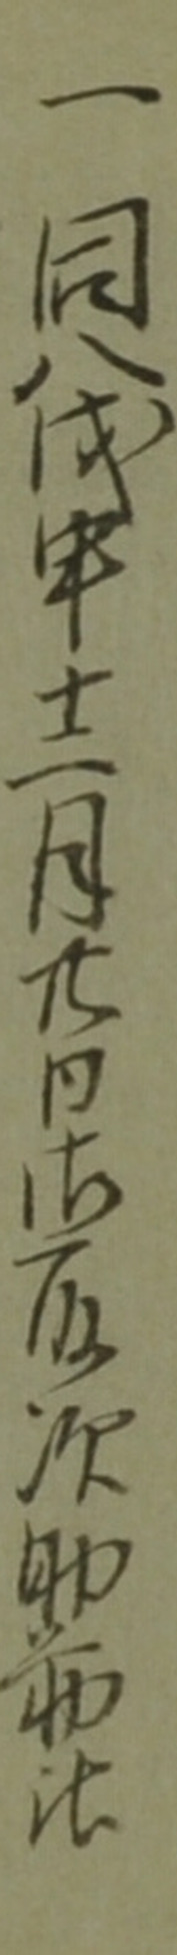一同八戊申十二月廿日御取次助勤被
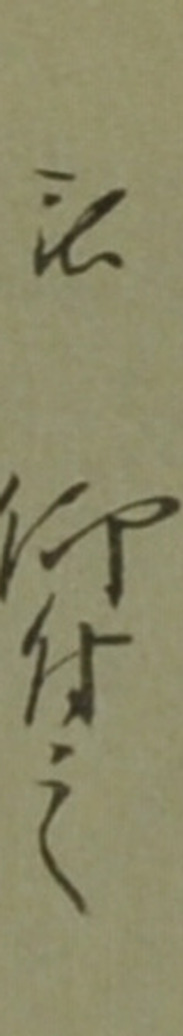被仰付之
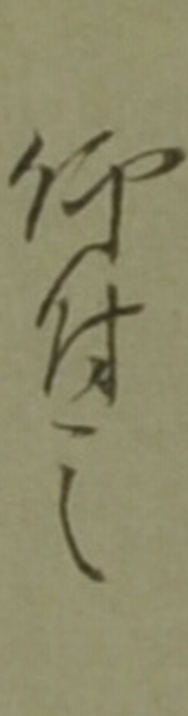仰付之
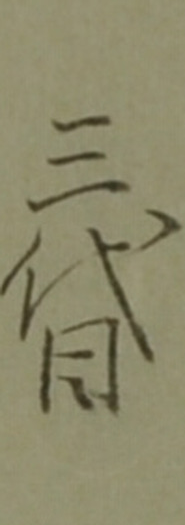三代目
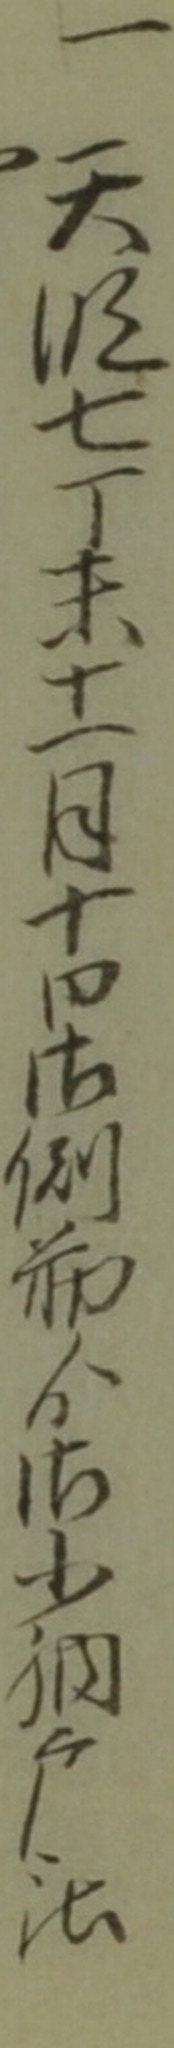一天明七丁未十一月十日御側勤ゟ御小納戸
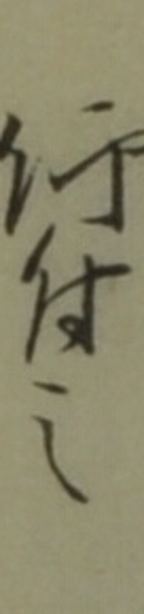仰付之
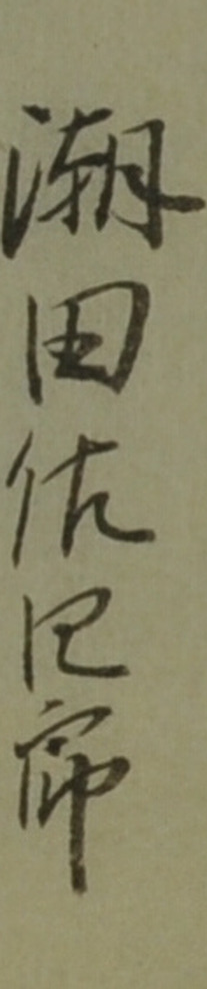潮田佐四郎
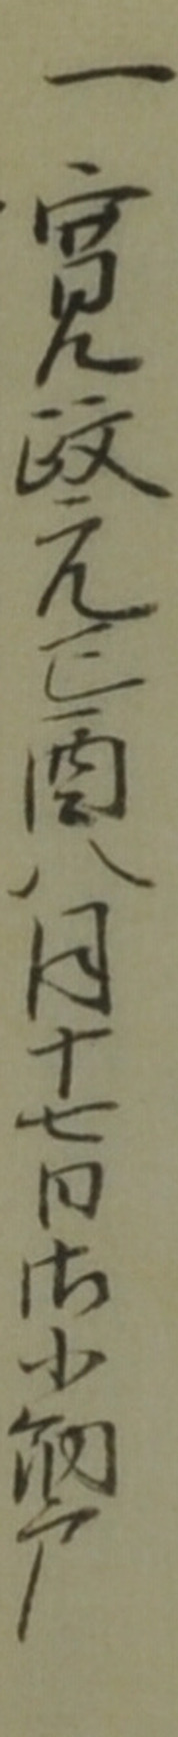一寛政元己酉八月十七日御小納戸
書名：諸御役代々録（四）
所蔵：伊那市立高遠町図書館・合同会社AMANE
